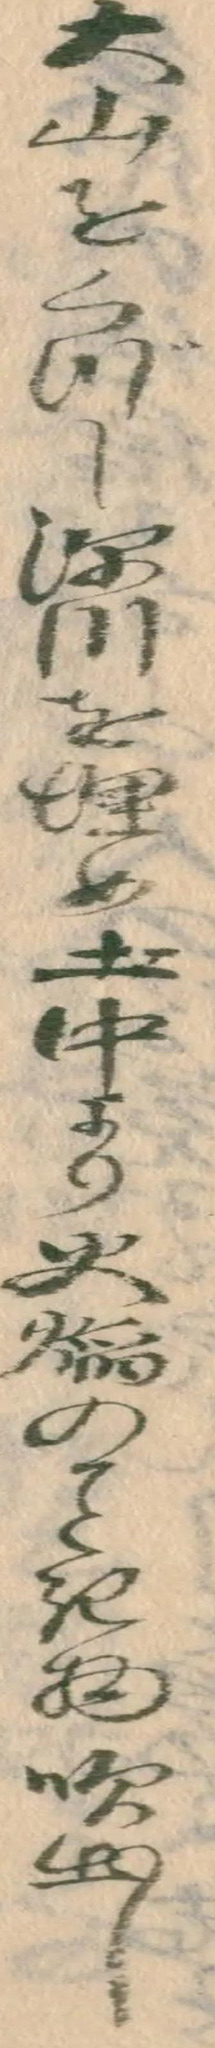大山をくずし深川を埋め土中より火焔のことき物吹出し
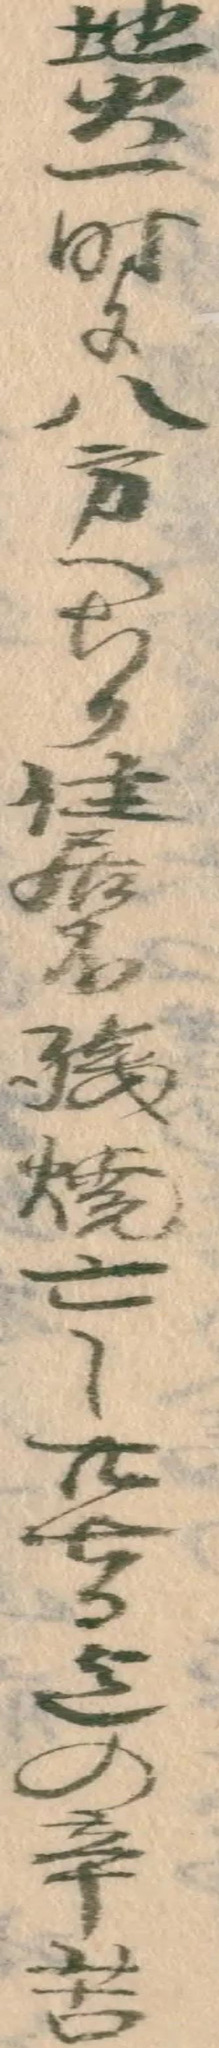地火一時に八方へちり住居不残焼亡し廿七日迄の辛苦
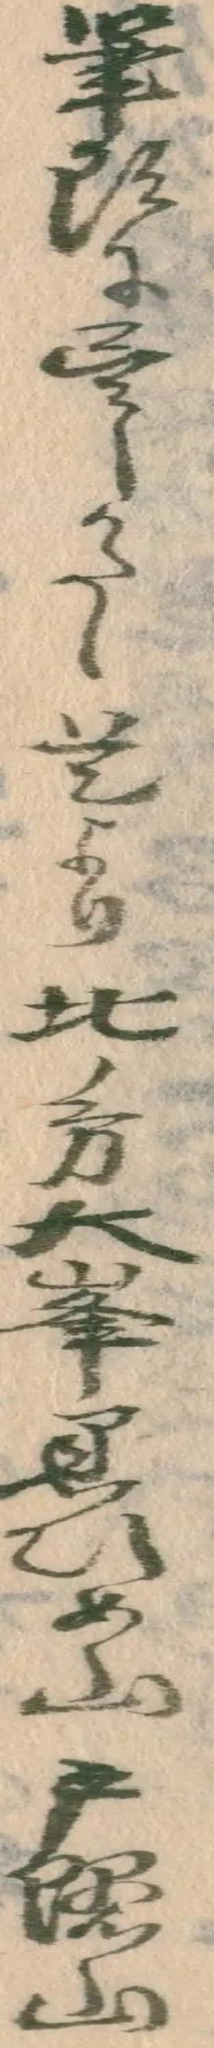筆紙に尽しかたし是より北ノ方大峯黒ひめ山戸隠山
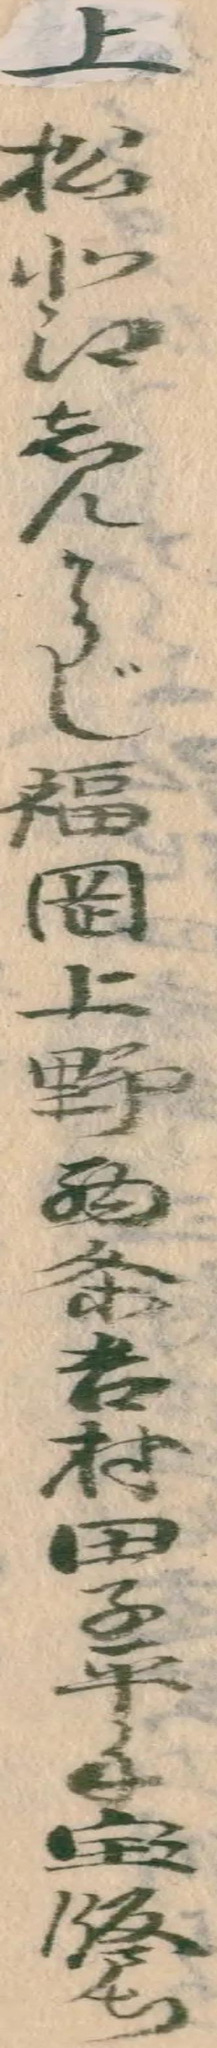上松北郷しんかうじ福岡上野西条吉村田子平手宝飯戸玉
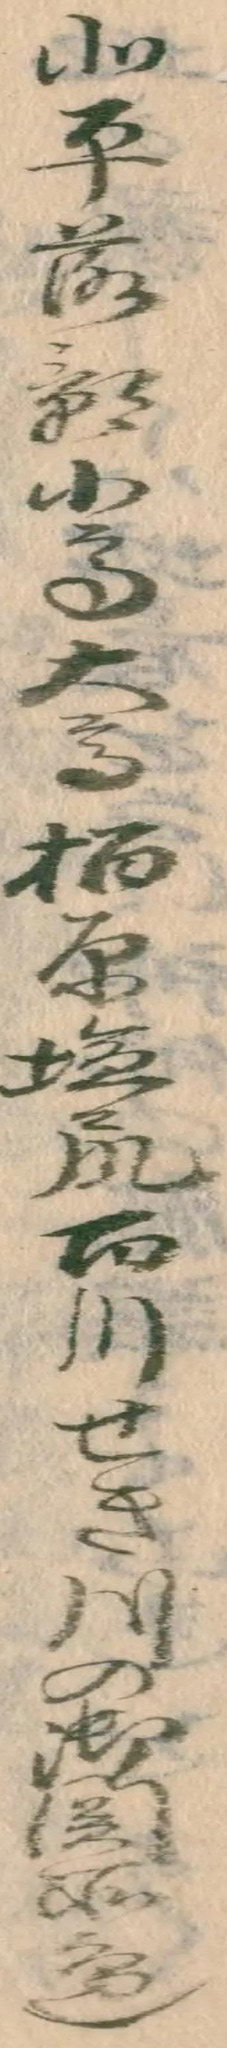北草落影小高大高柏原塩尻白川せき川の御関所辺
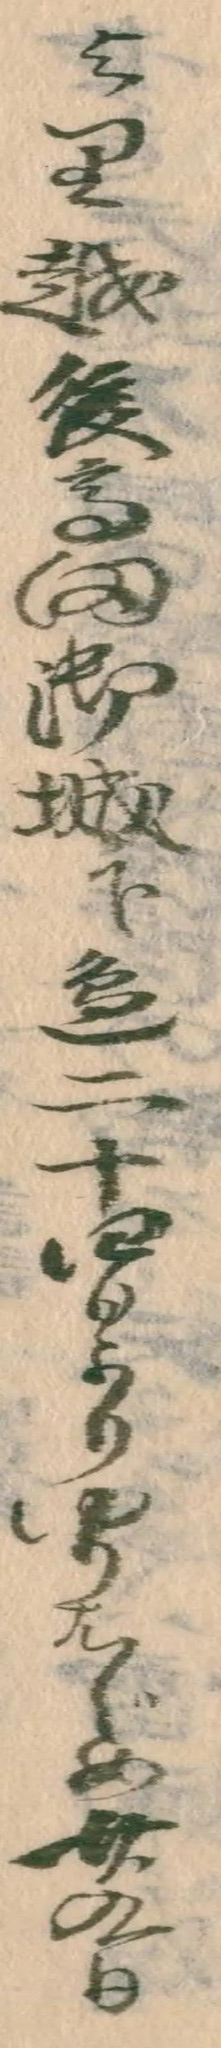より越後高田御城下辺二十四日よりゆりはじめ廿九日
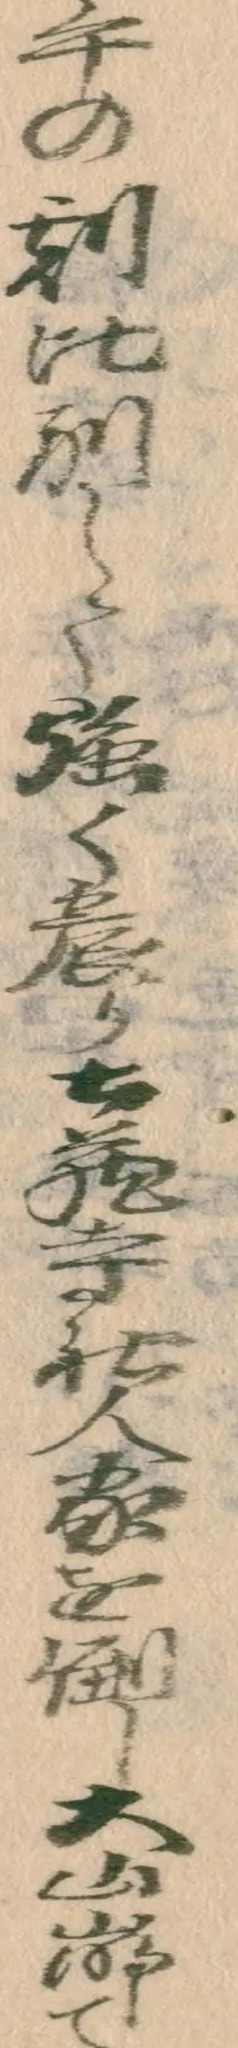午の刻比烈しく強く震り土蔵寺社人家を倒し大山崩して
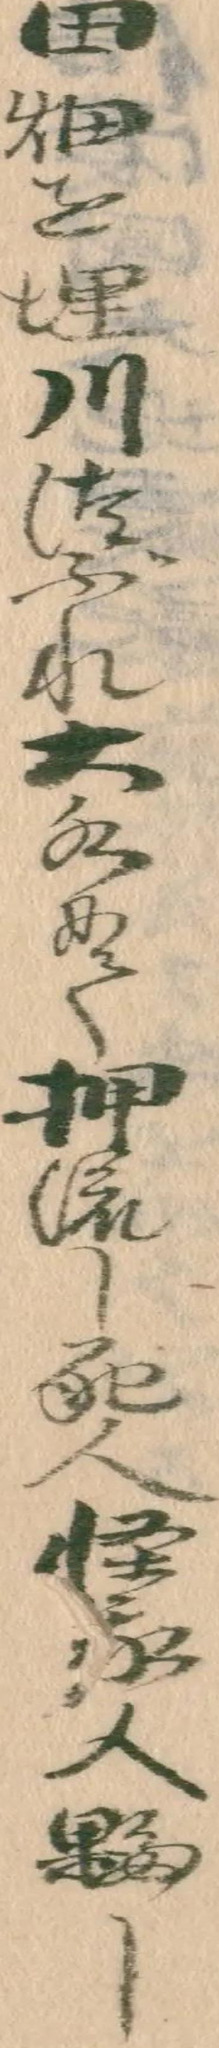田畑を埋川あふれ大水出て押流し死人怪我人夥し
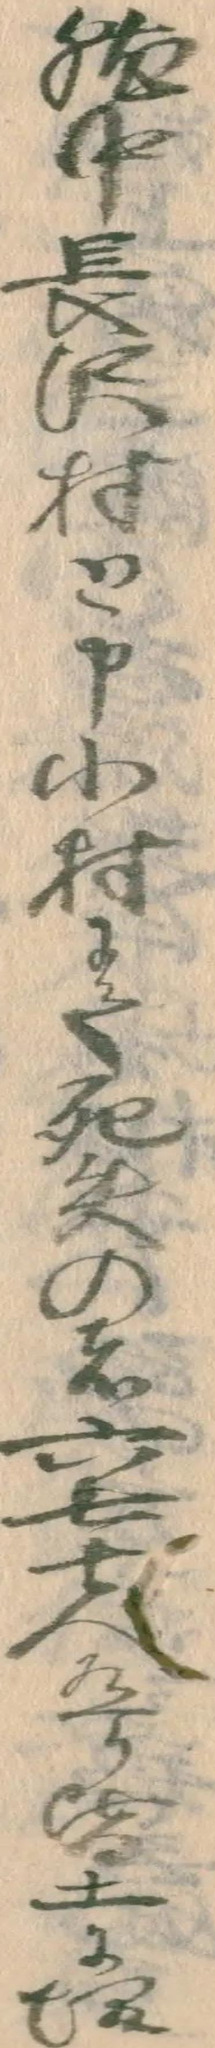就中長沢村と申小村にて死失の者六七十人有り皆土に埋
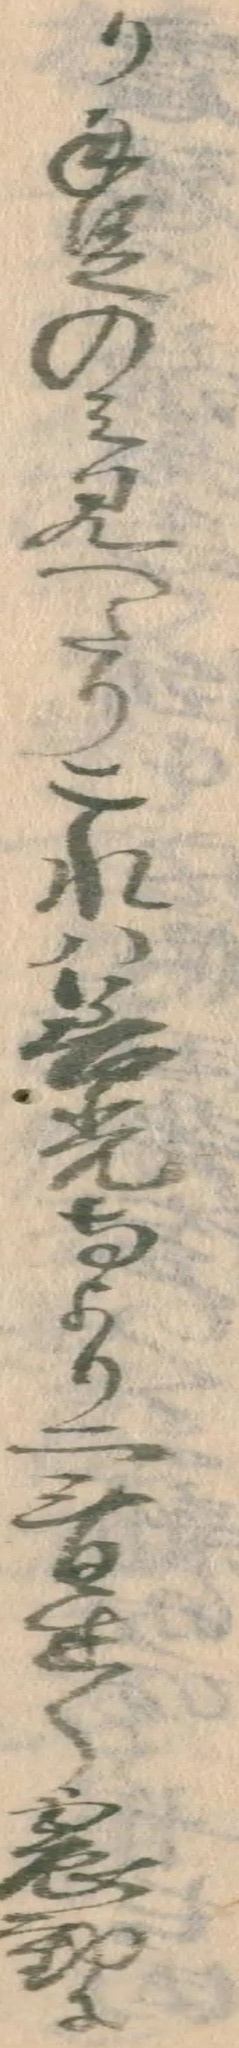り手足のミ見へたりこれハ善光寺より二三日速く震動に
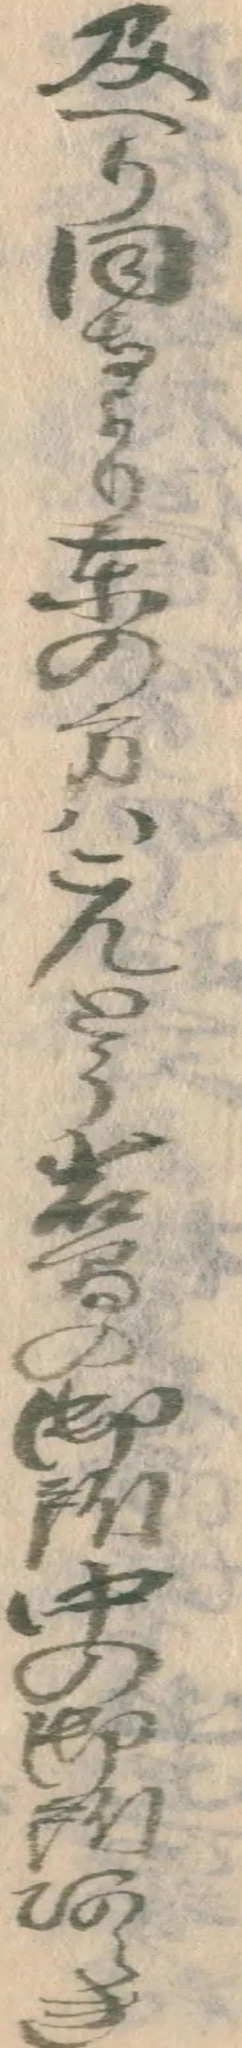及へり同寺より東の方ハこんとう岩間の御所中の御所あらき
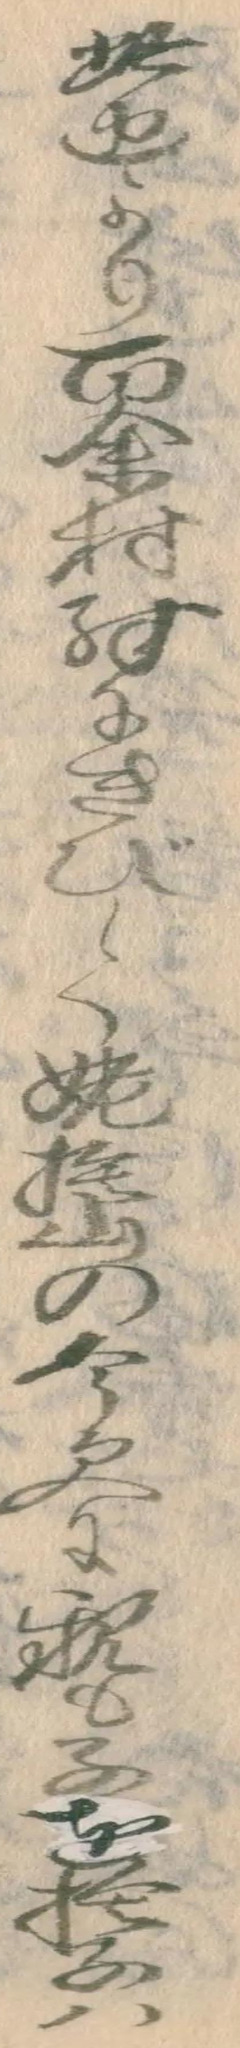此辺より百余村殊にきびしく姥捨山の今更に親に子を捨子ハ
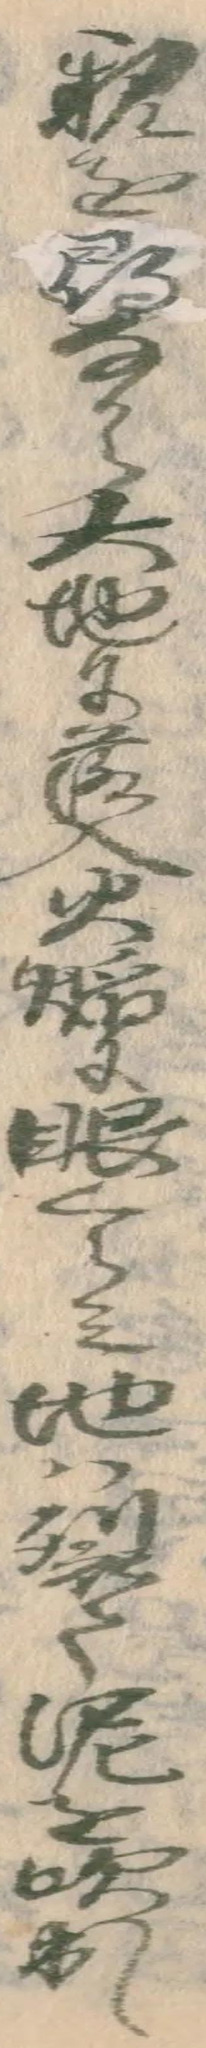親を尋なから大地に落入火焔に眼くらミ地ハ裂て泥を吹出し
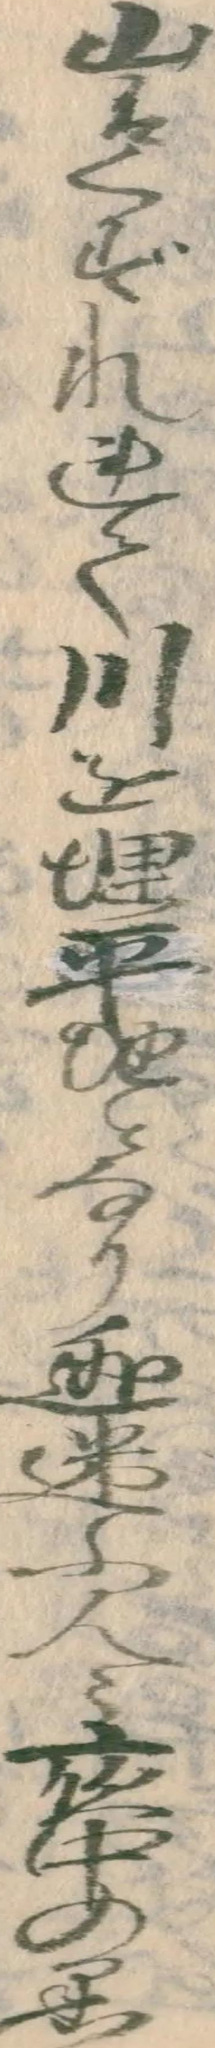山はくずれれて川を埋平地となり逃迷ふ人々夜中の果
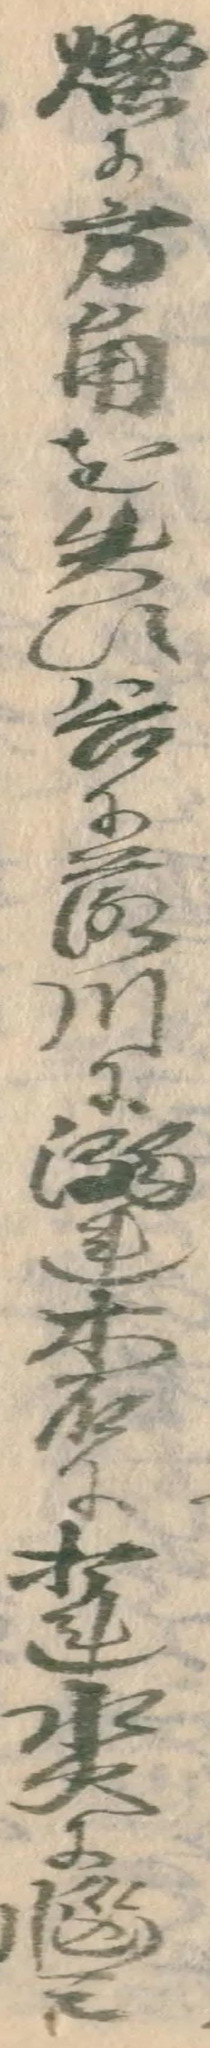煙に方角を失ひ谷に落川に溺れ木石に打れ水火に悩ミ
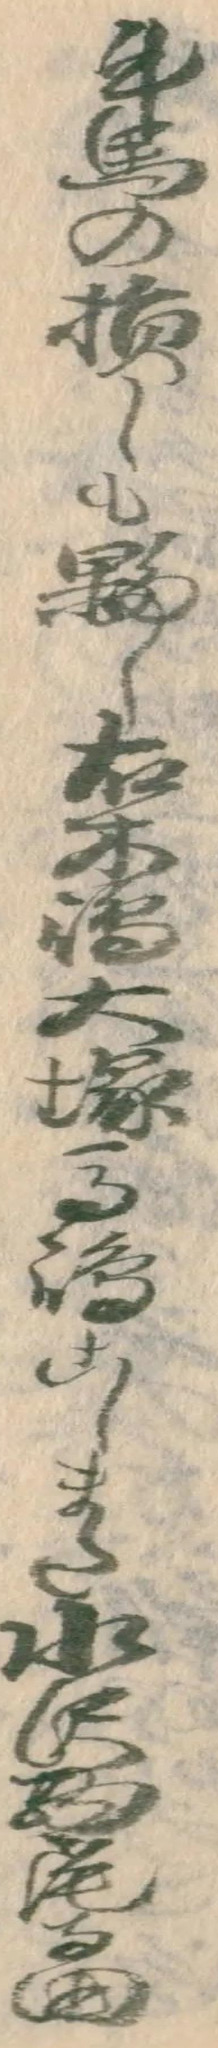牛馬の損しも夥し右木嶋大塚馬嶋こしまた水沢曲尾寺田
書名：信州大地震之記
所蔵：国立国会図書館 National Diet Library, JAPAN
